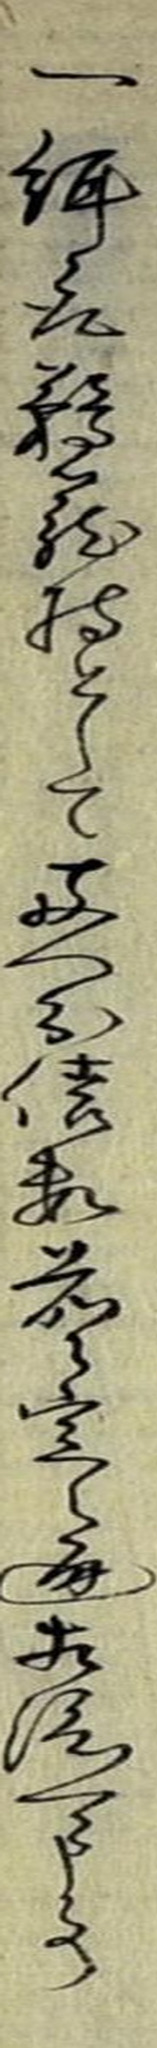一餌取鵜籠持として両人分俵数前々定之通相渡可申事
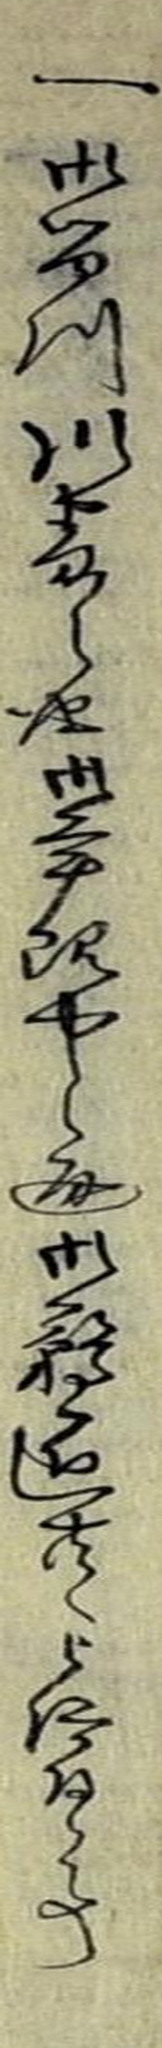一御留川川番之儀御年限中之通御鵜匠共へ被仰付候事
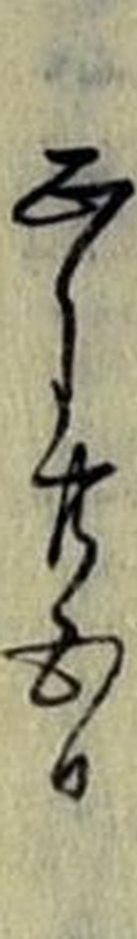正月廿五日
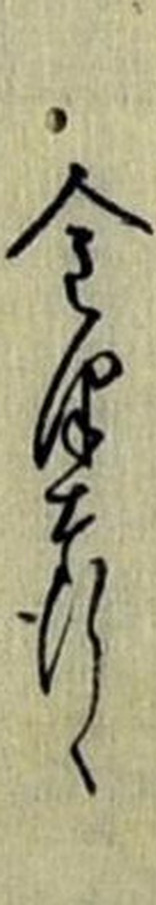金津奉行へ
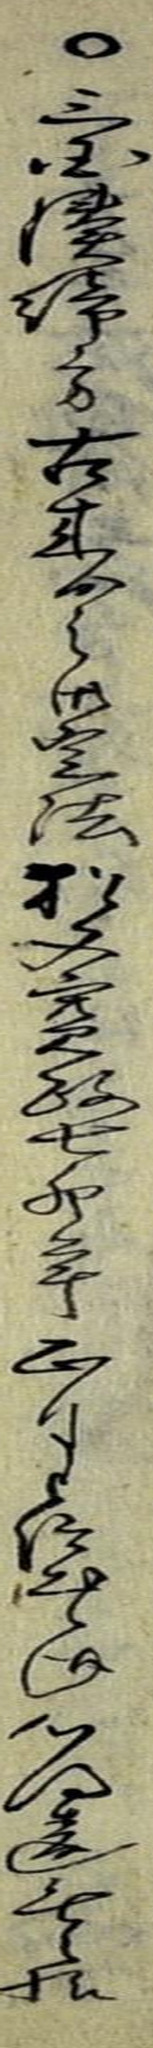○三国湊締方古来ゟ之御定法猶又寛政七卯年正月被仰出候趣心得違無之様
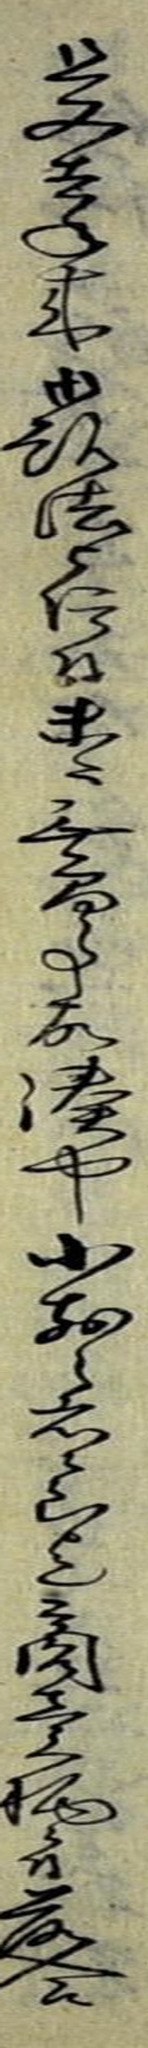且又去年來御趣法被仰付候に付未た無間事故湊中小前之者に至る迄商売柄に付落合
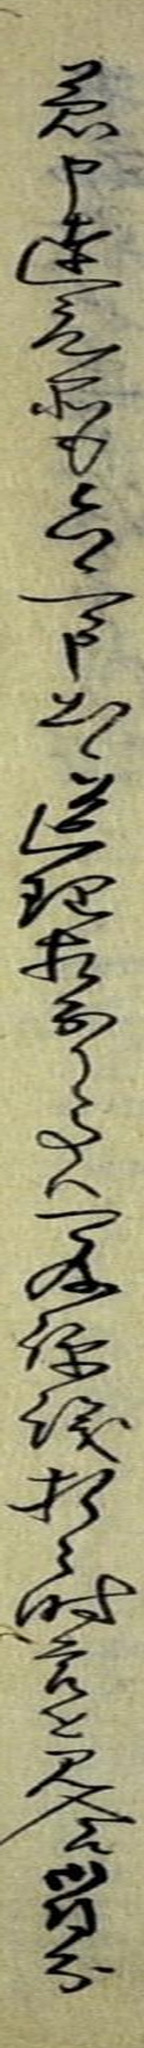兼申達度品も候はヽ可申出候道理相分り候事は可及評儀折々時節を見合御自分
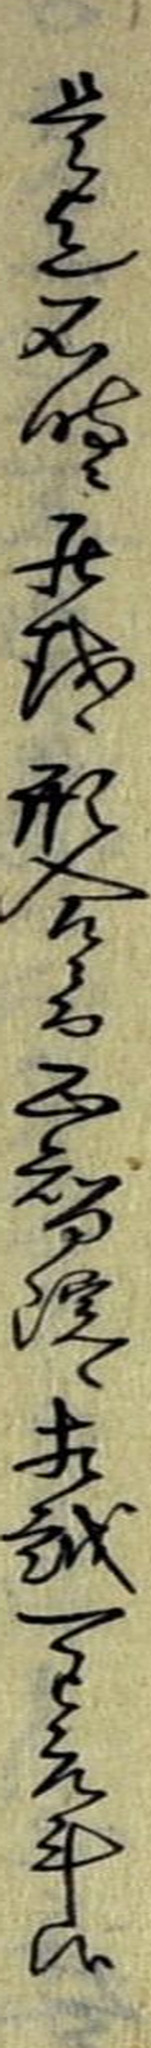是迄不時に罷越候形合に而正智院へ相越可被取斗候
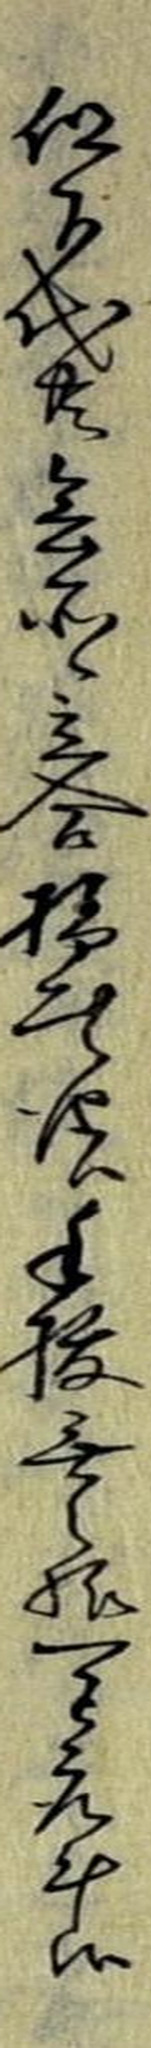但下代共会所へ立合指出候儀は手抜無之様可被取斗候
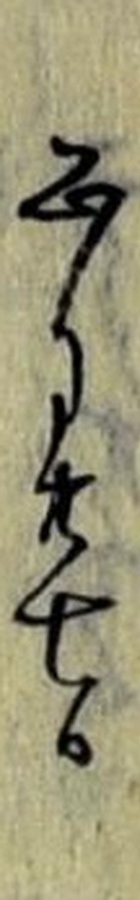正月廿七日
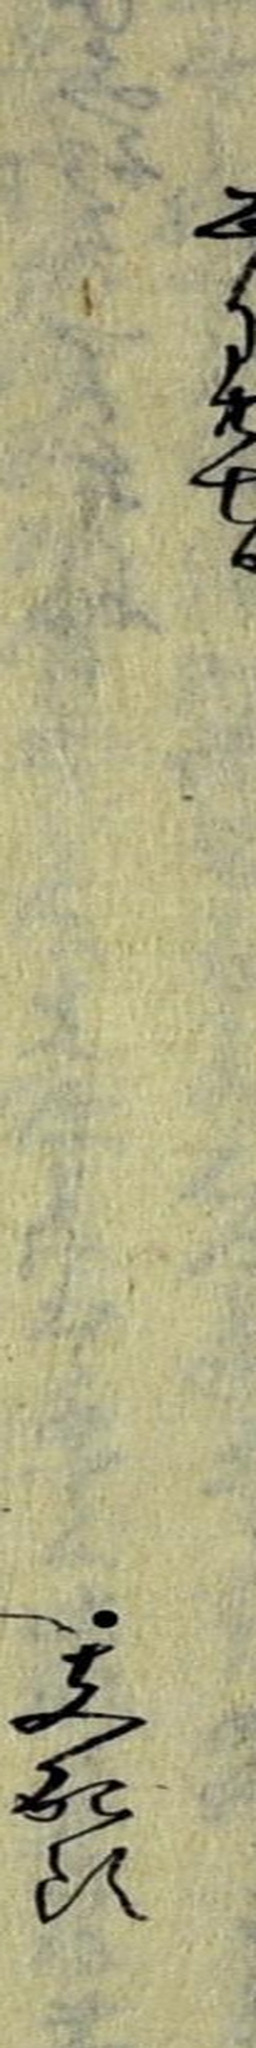支配頭
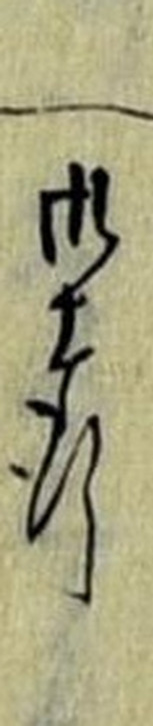御奉行
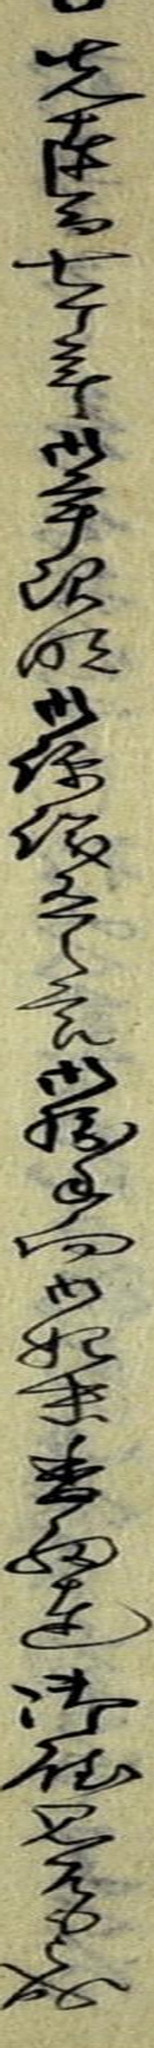○先達而七ヶ年御年限明御評儀有之節御勝手向御始末委細達御聴思召も被成
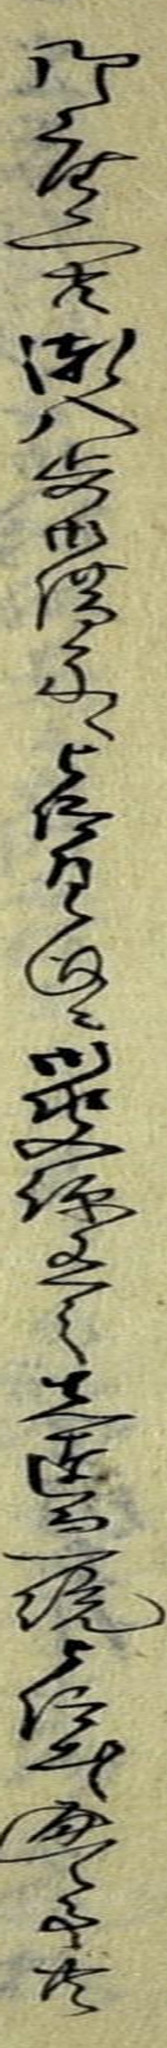御座候へ共漸八歩御借米へ被仰付候趣に御決評有之先達而一統被仰出候通之事共
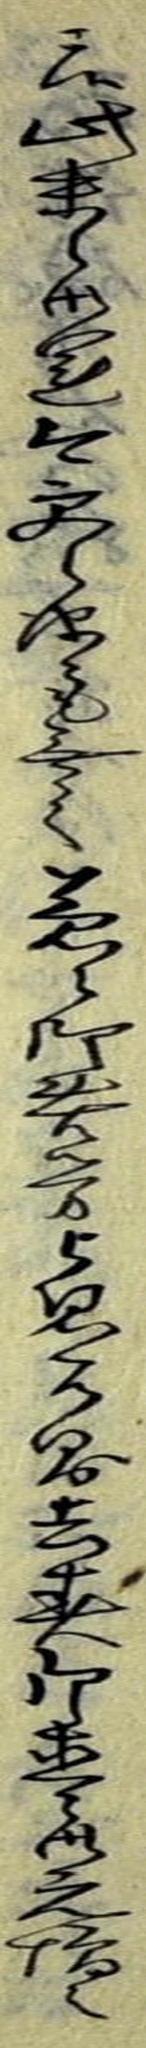に候此末之御運今更之儀にも無之兼々御苦労被思召則去春御直々御元増之
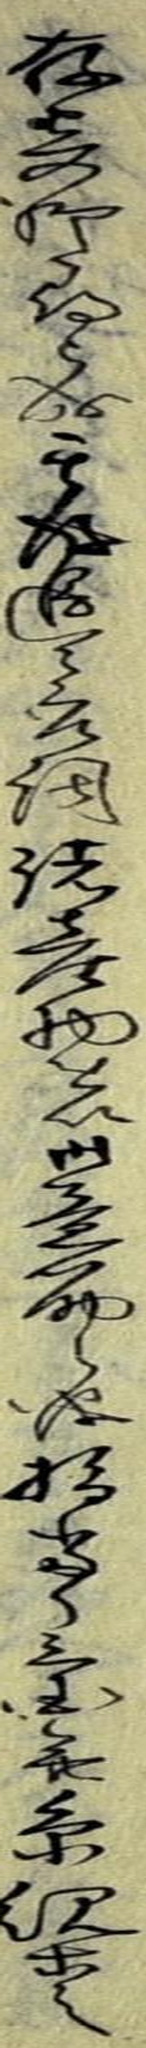存寄御尋被成其後追々取調諸産物を以御益筋之儀指当り三国并糸繭等之
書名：命令之部 四
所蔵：福井県文書館 Fukui Prefectural Archives
